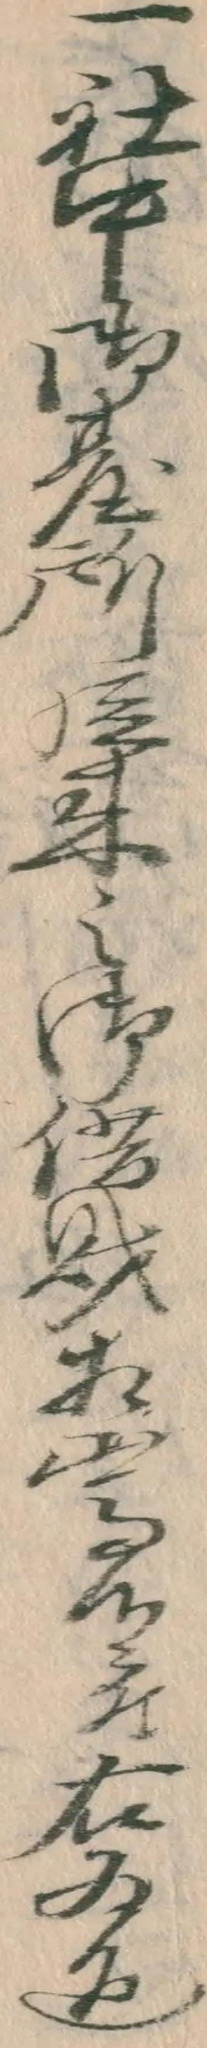一社中御臺所従来之御借財相嵩候ニ付右為返
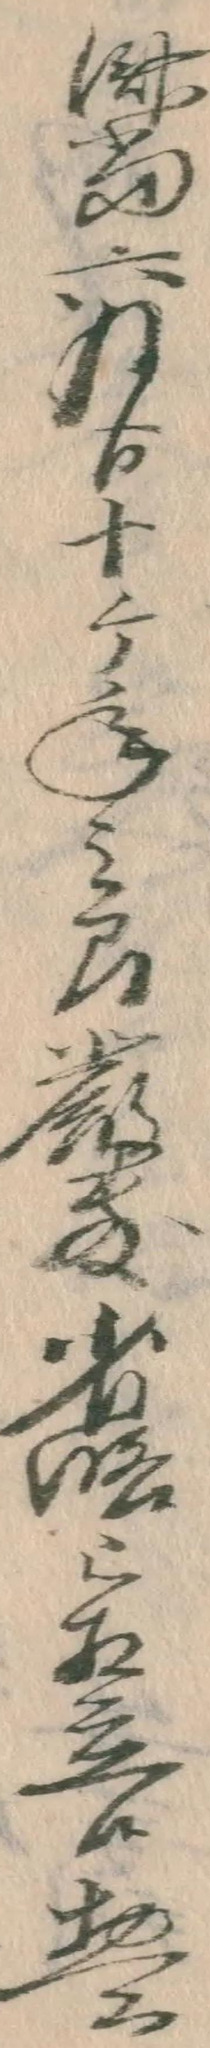済當六月ゟ十ヶ年之間厳敷省略被相立候惣而
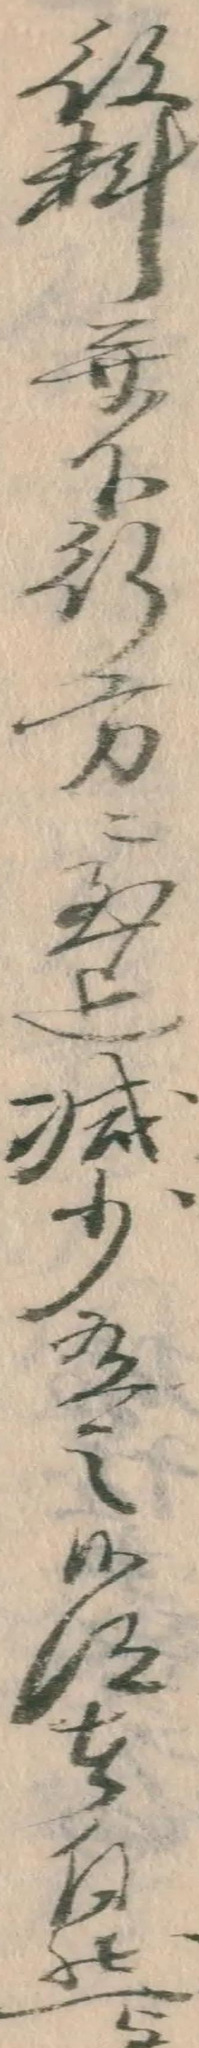役科并下行方に至迄減少有之候得は自然と
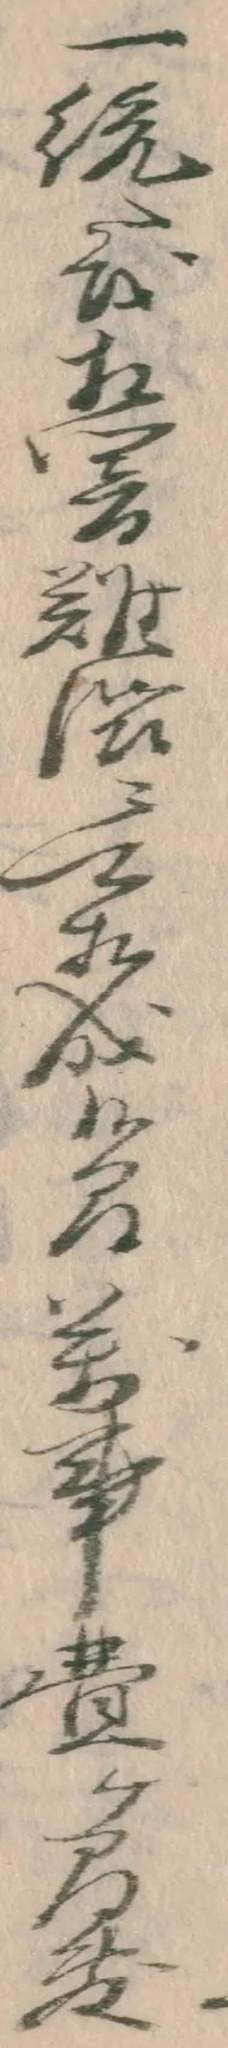一統へも相鬮難渋ニ可相成候間萬事費ヶ間敷
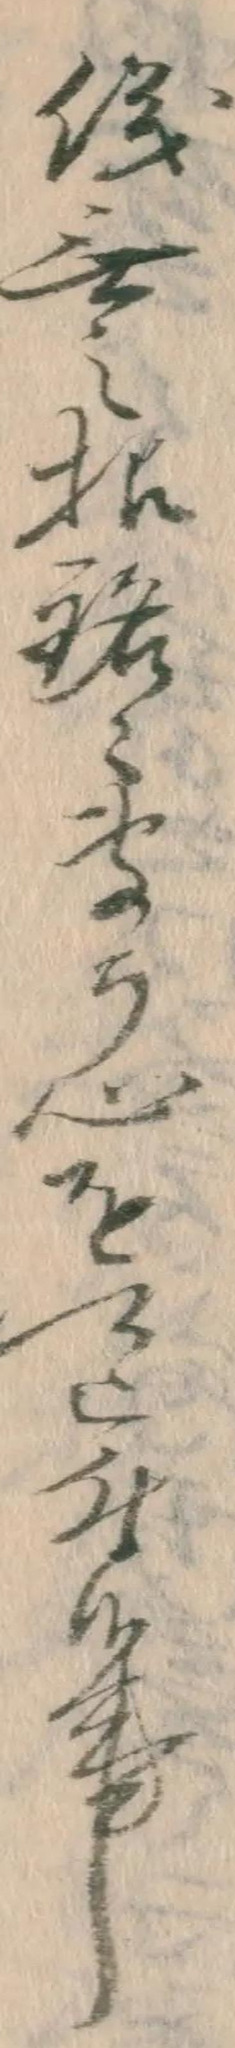儀無之様銘々専ラ心を以被付候事
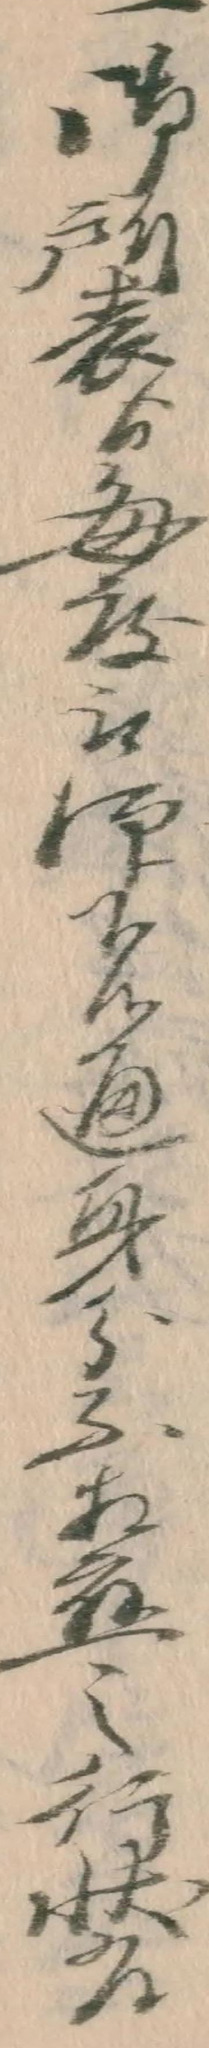一御所表ゟ毎度被仰下候通身分不相應之行状有
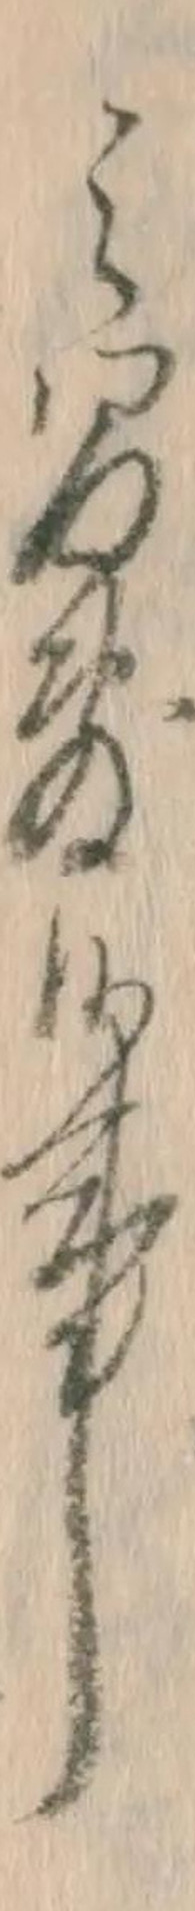之間敷候事
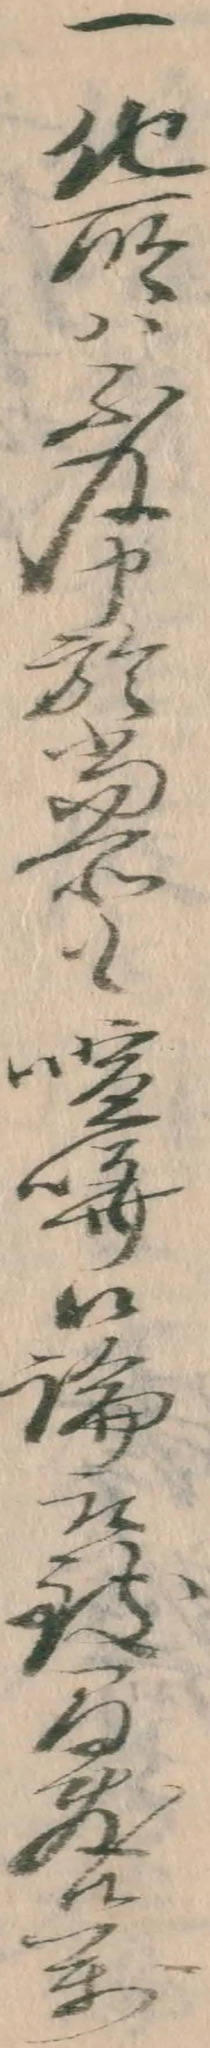一他所ハ不及申於當所も喧嘩口論取致間敷候萬
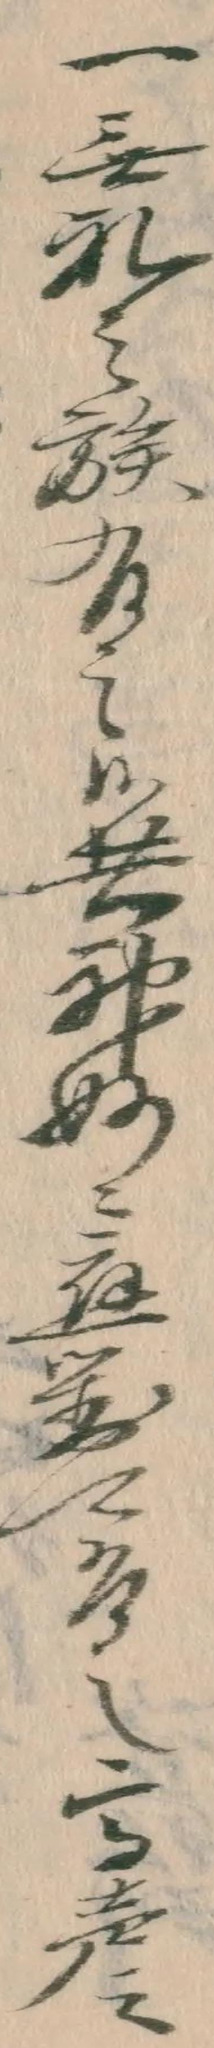一無礼之族有之候共神妙ニ應對可有之高声之
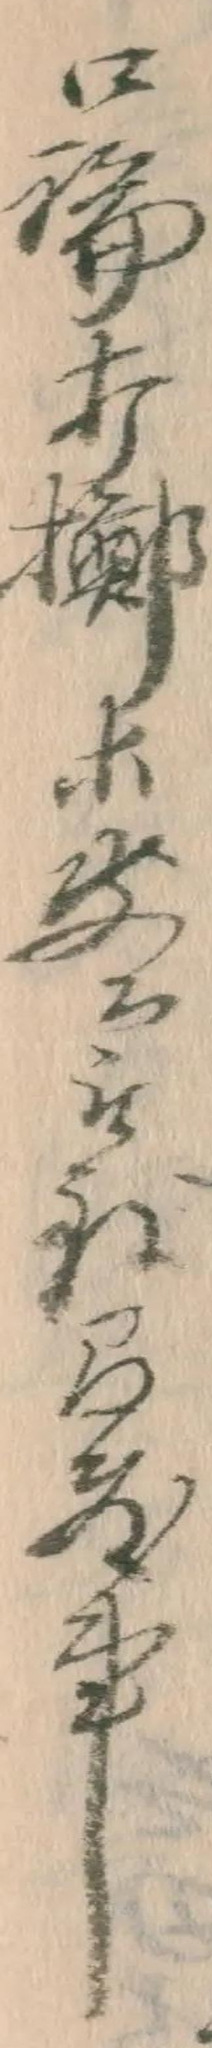口論打擲等決而被致間敷事
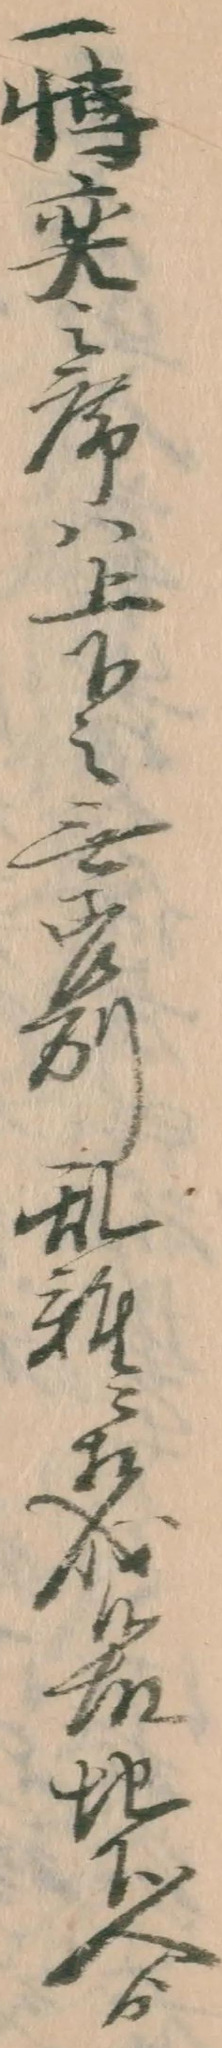一博奕之席ハ上下之無差別乱雑ニ相成候故地下人ゟ
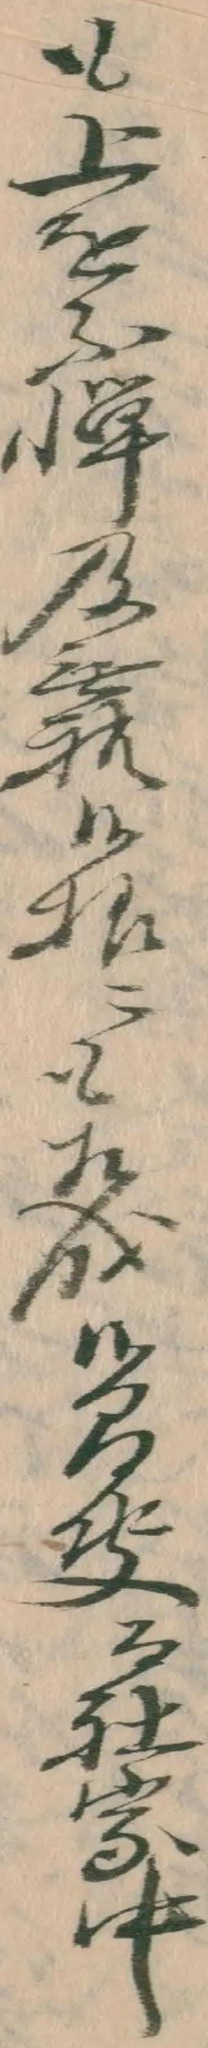も上を不憚及無禮候様二も相成候間決而社家中
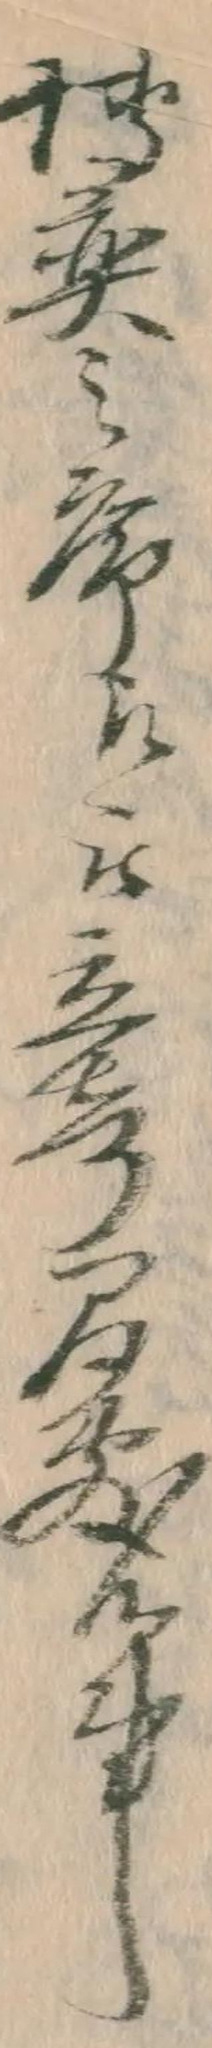博奕之席え被立寄間敷候事
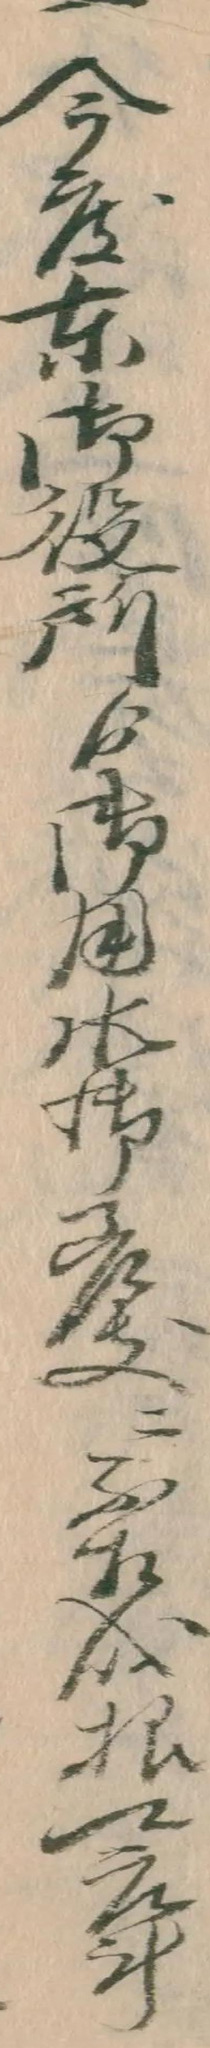一今度東御役所ゟ御用水御差支ニ不相成様可取斗
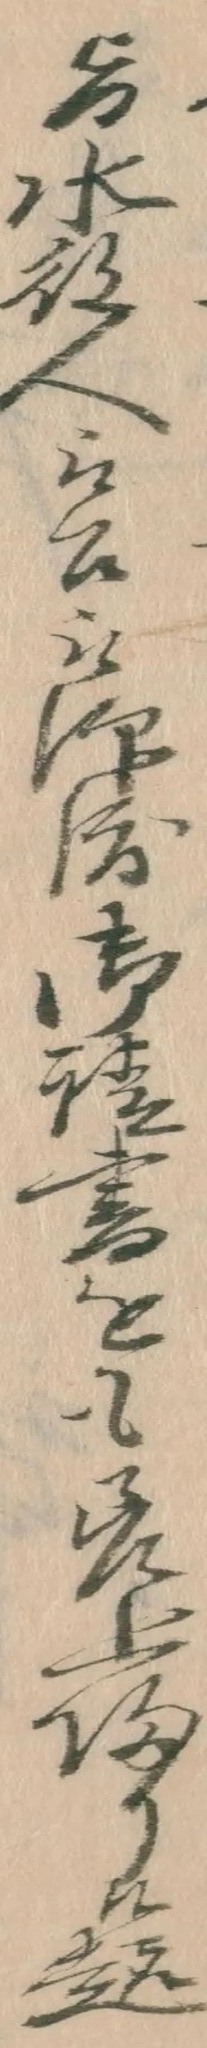旨水役人被召被仰渡御請書をも差上帰り候趣
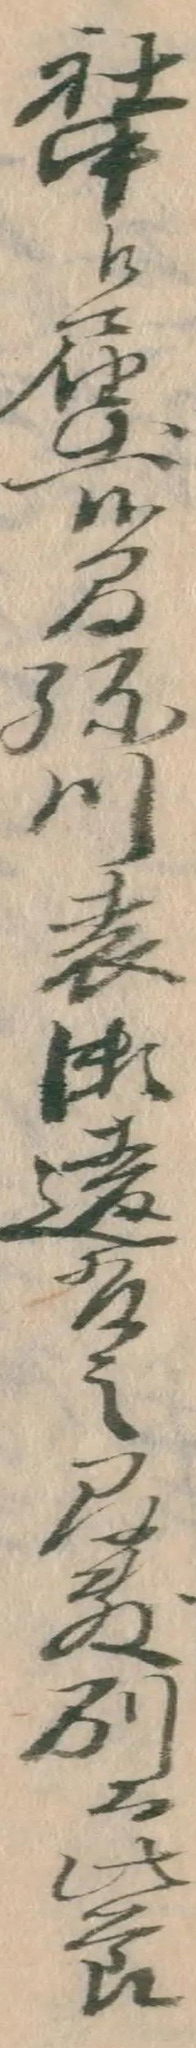社中江届出候間弥川表御違有之間敷別而此節
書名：賀茂社記録. 第67冊
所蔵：国立国会図書館 National Diet Library, JAPAN
